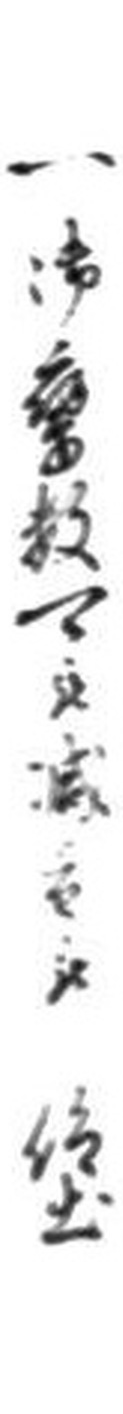一御鷹数可被減旨被仰出
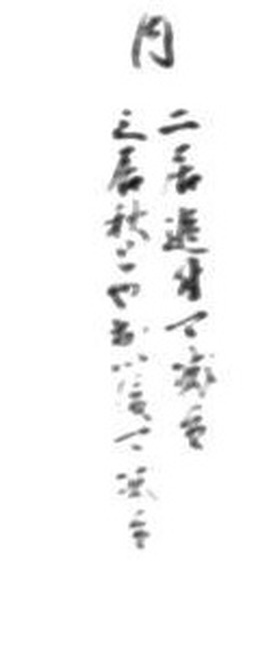三居秋とや出以後可減旨
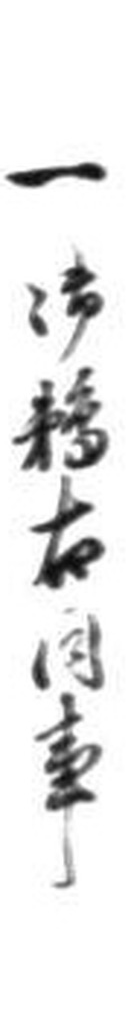一御鵜右同事
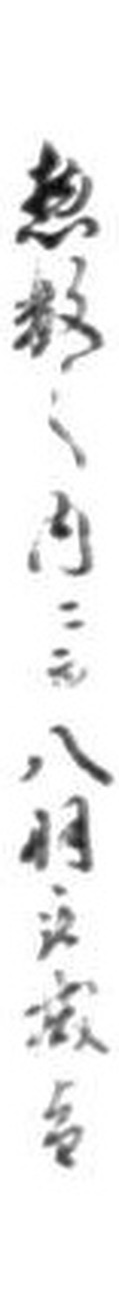惣数之内ニ而八羽被減旨
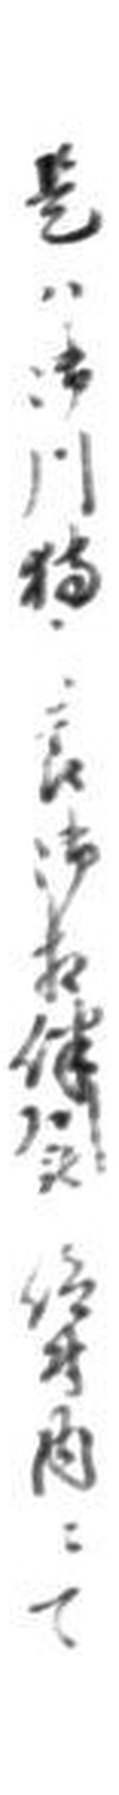是ハ御川狩之節御相伴被仰付内ニて
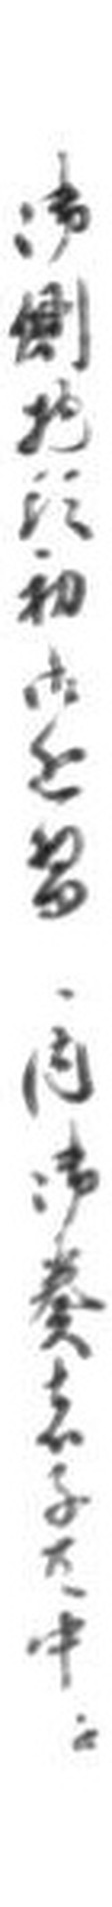御側物頭初御近習之内御奏者子共中江

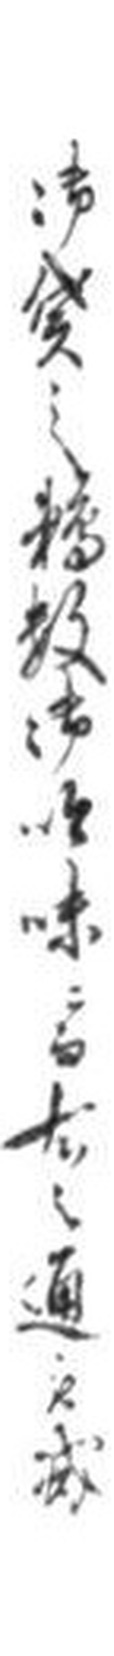御貸之鵜数御吟味ニ而右之通被減
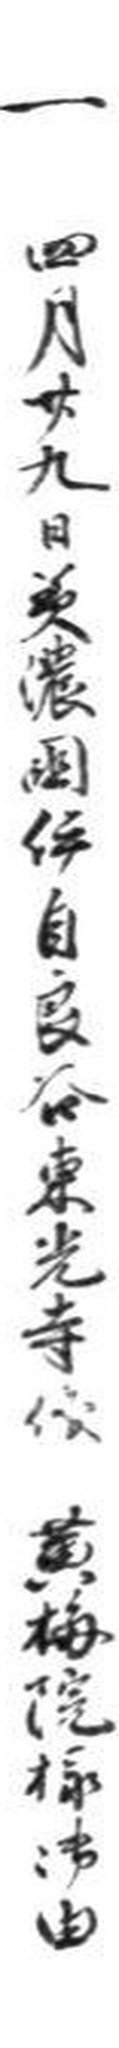一四月廿九日美濃国伊自良谷東光寺儀黄梅院様御由
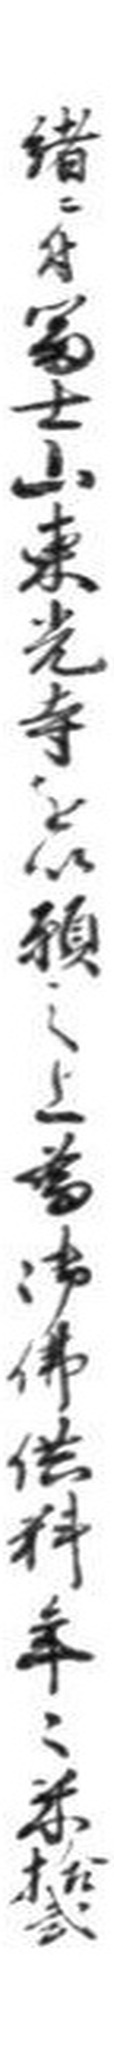緒ニ付富士山東光寺を以願之上為御仏供料年々米拾弐
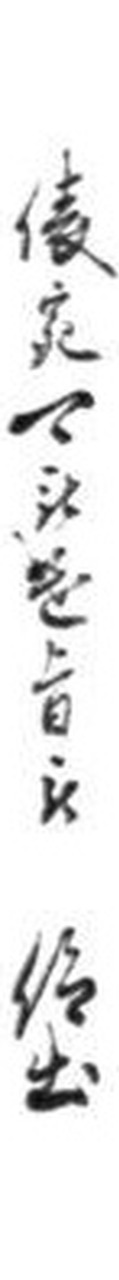俵宛可被遣旨被仰出
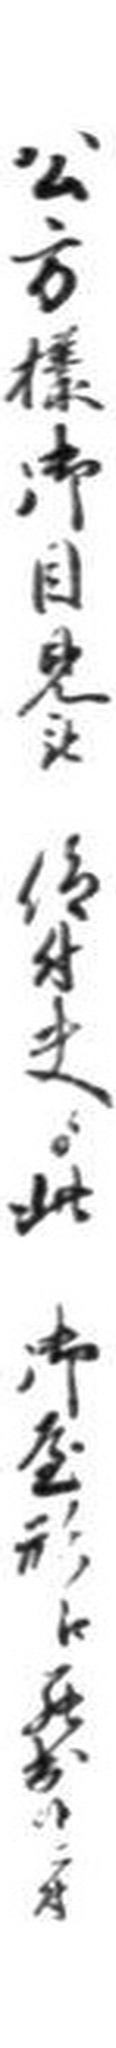公方様御目見被仰付夫ゟ此御屋形江罷出候ニ付
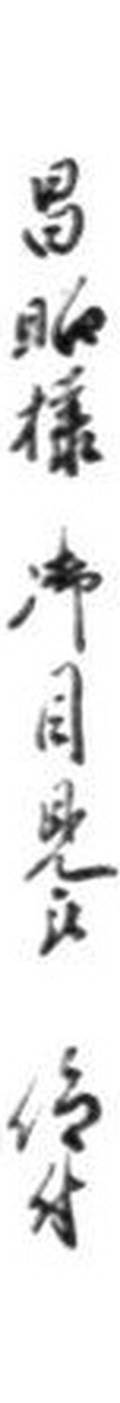昌昭様御目見被仰付
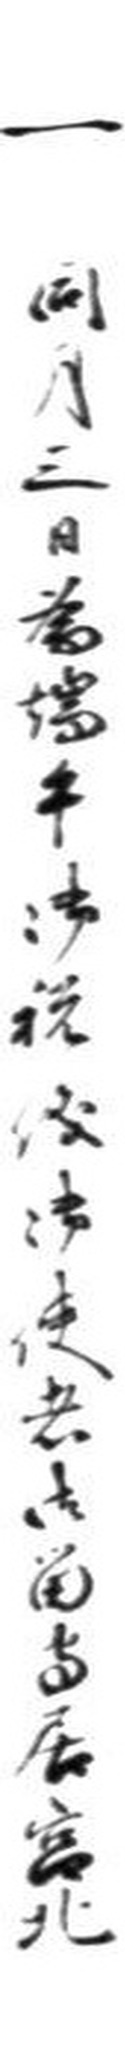一同月三日為端午御祝儀御使者御留守居宮北
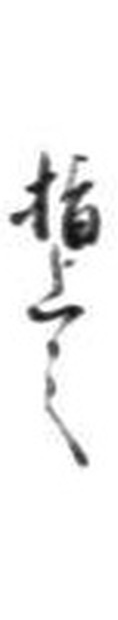指上之
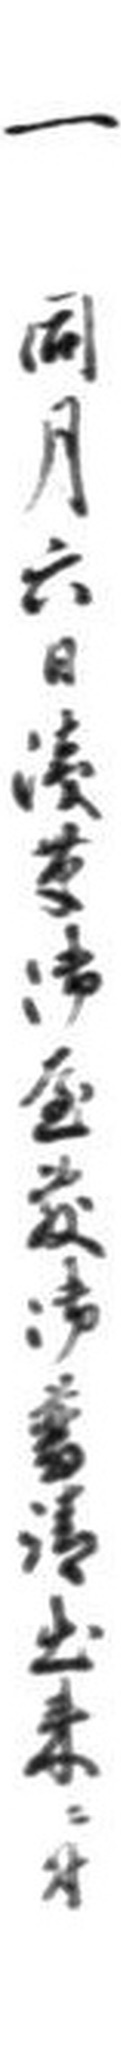一同月六日浅草御屋敷御普請出来ニ付
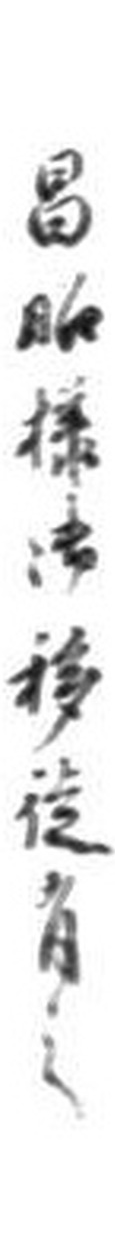昌昭様御移徒有之
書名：家譜 三十六 宗昌公 従享保八年到同九年
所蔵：福井県文書館 Fukui Prefectural Archives
